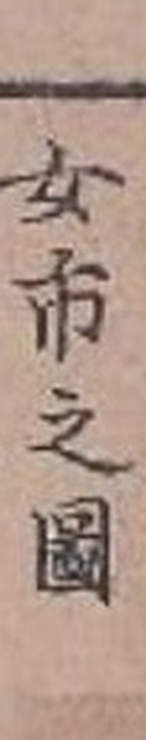女市之図

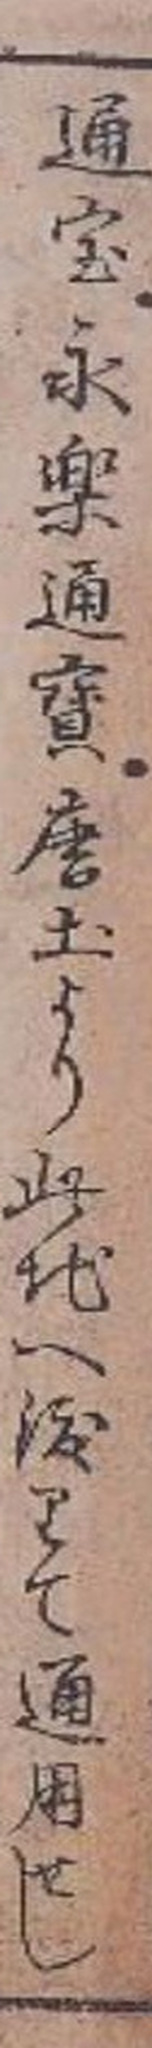通宝、永楽通宝、唐土より此地へ渡りて通用せし
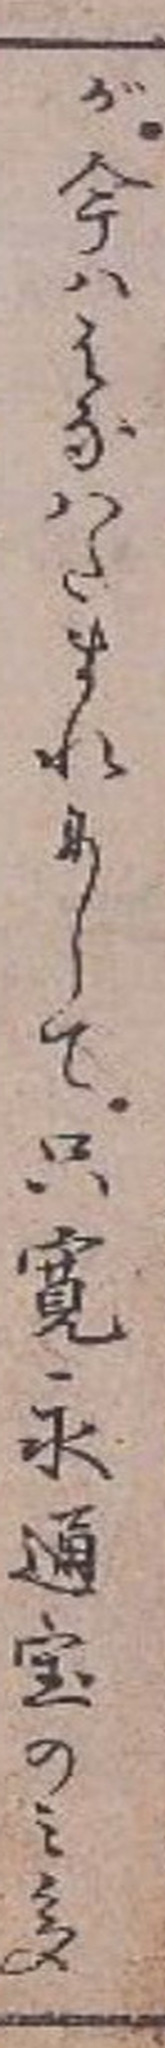が、今ははなはたまれにして、只寛永通宝のみ多
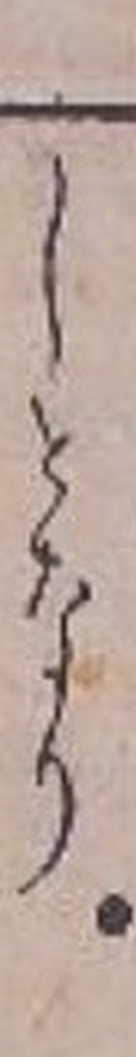しとなり、
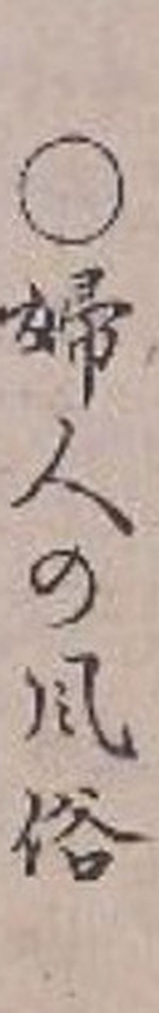〇婦人の風俗
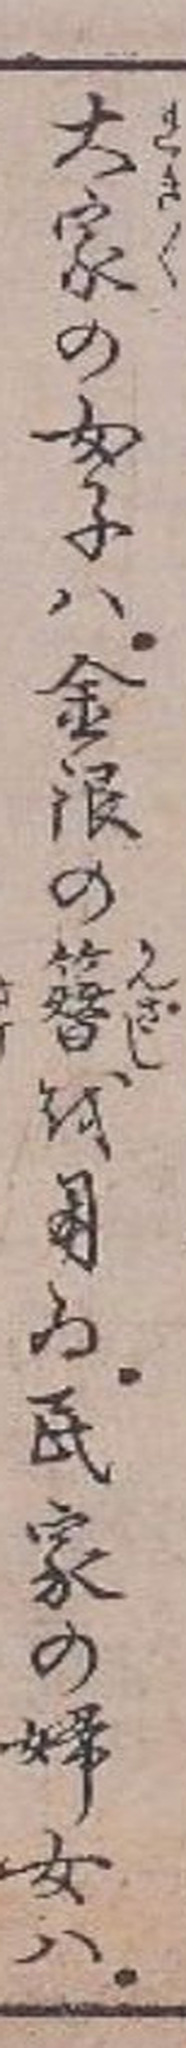大家の女子は、金銀の簪を用ゐ、民家の婦女は、
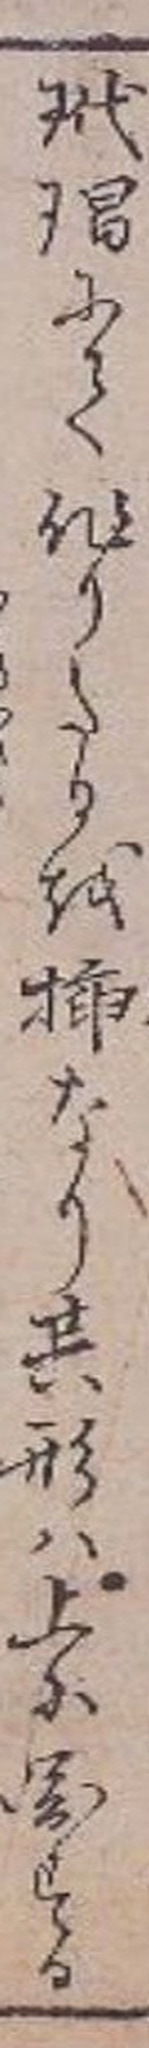玳瑁にて作りたるを挿なり其形は、上に図する
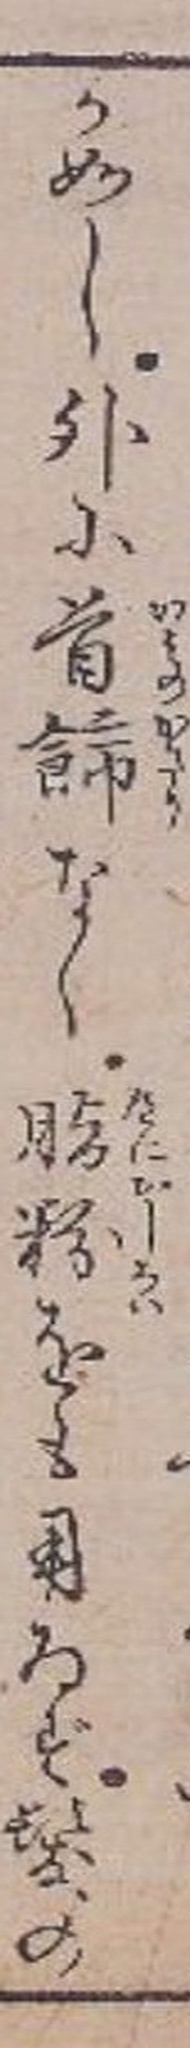か如し、外に首飾なし、脂粉をも用ゐず、髪の
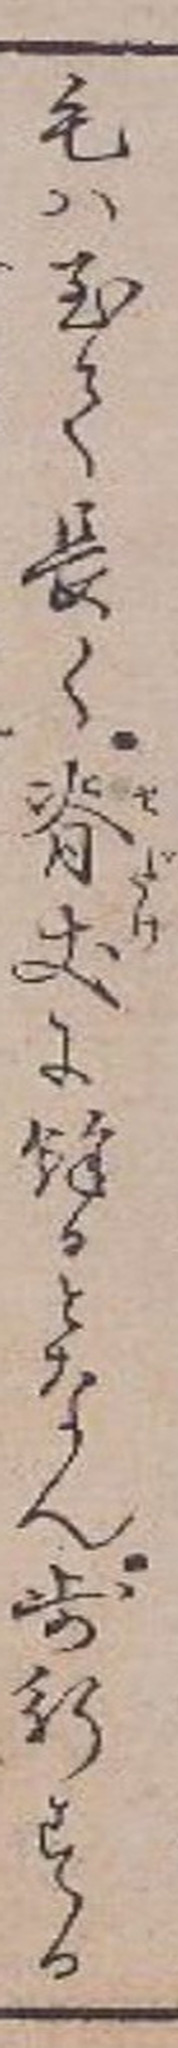毛は至て長く、背丈に余るとなん、歩行する
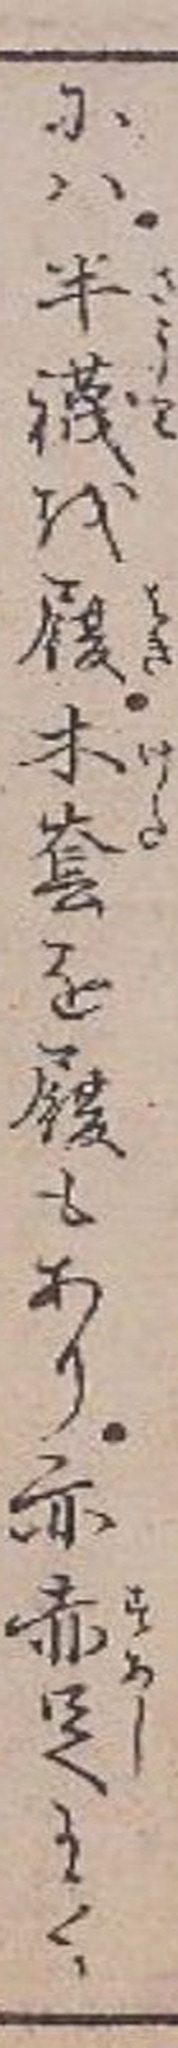には、半襪を履、木套を履もあり、亦赤足にて
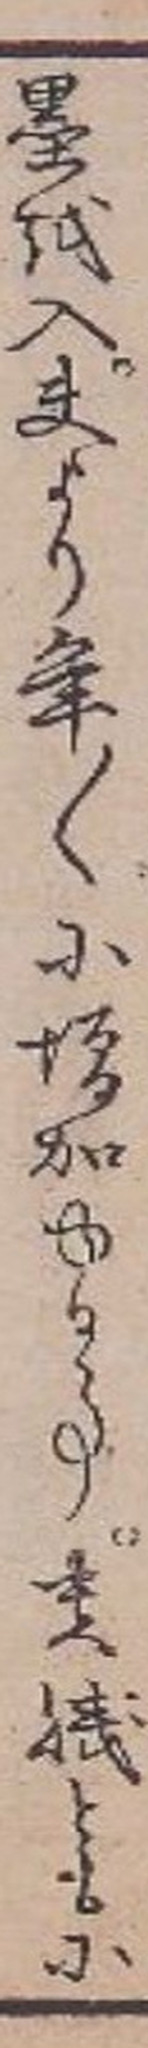墨を入、夫より年〳〵に増加ゆる事、貴賤ともに
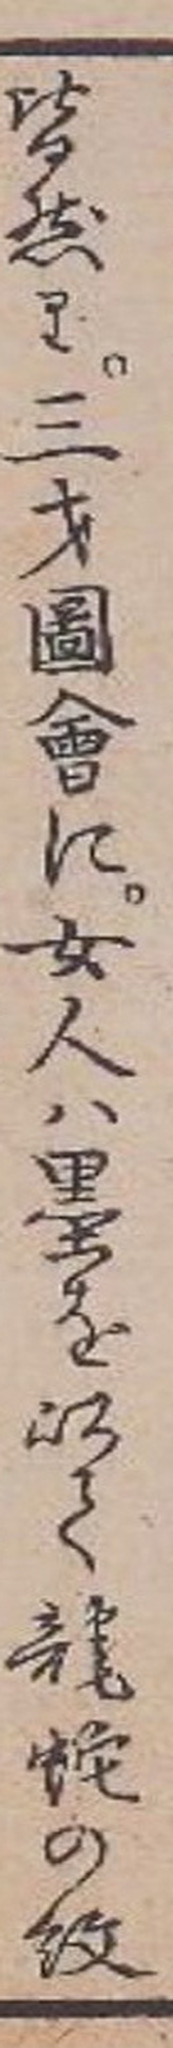皆然り、三才図絵に、女人は墨を以て龍蛇の紋
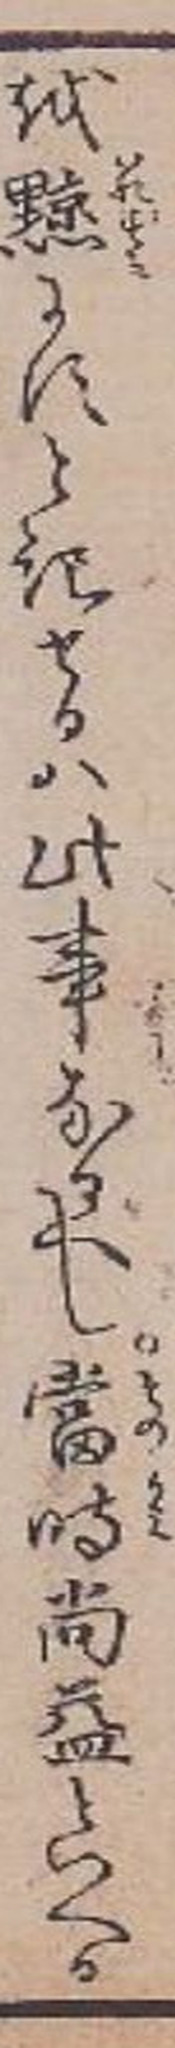を黥にすと記せるは此事なるへし、当時尚益といへる
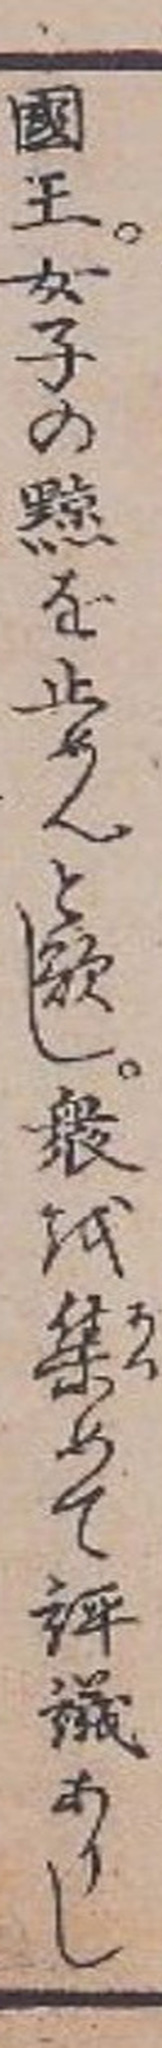国王、女子の黥を止めんと欲し、衆を集めて評議ありし
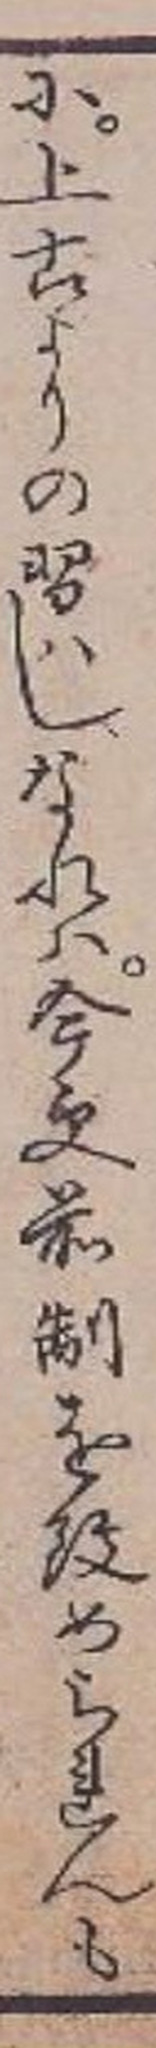に、上古よりの習はしなれは、今更前制を改められんも
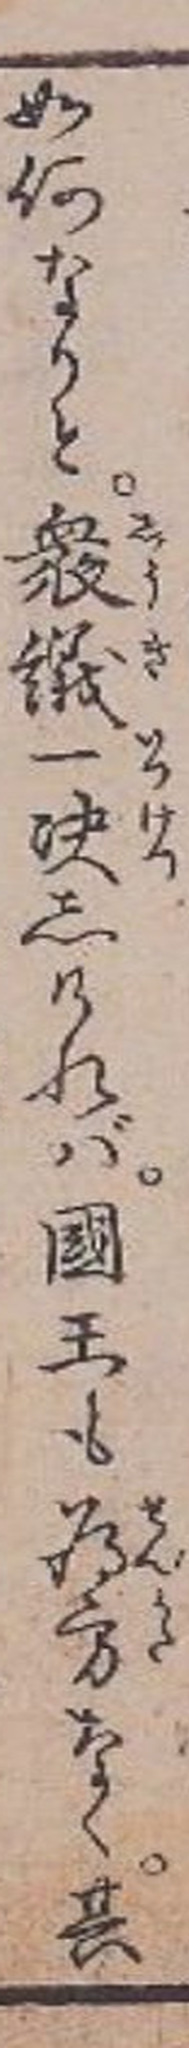如何なりと、衆議一決しければ、国王も為方なく、其
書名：琉球談
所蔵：University of the Ryukyus Library
